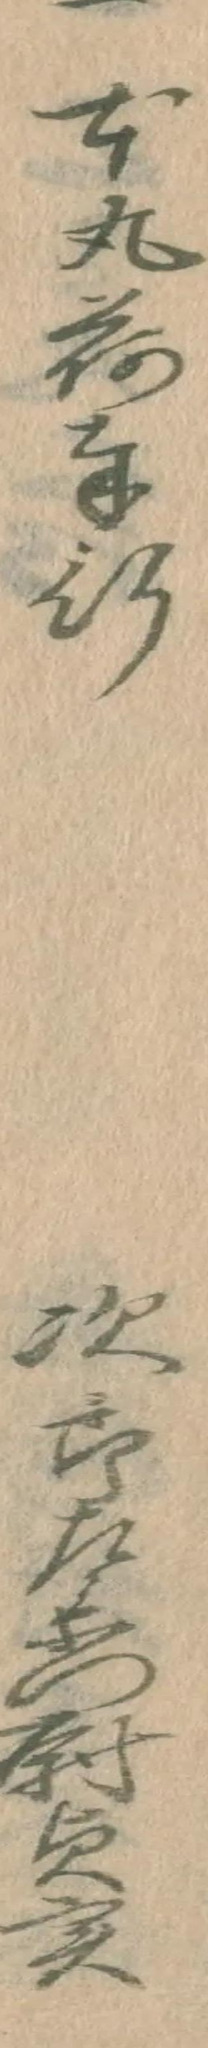一本丸荷奉行次郎左衛門尉貞実
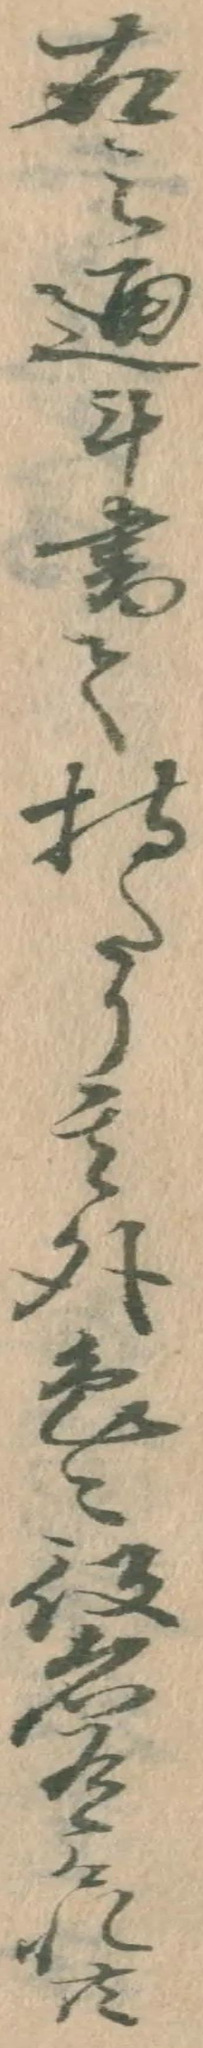右之通斗書て持たり其外色々役名有けれ共
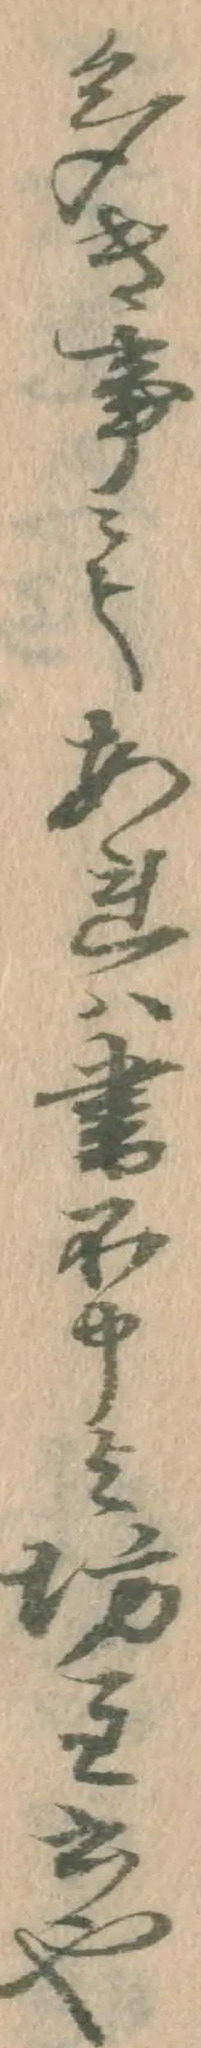多き事にてあ連は書不申与坊主云也
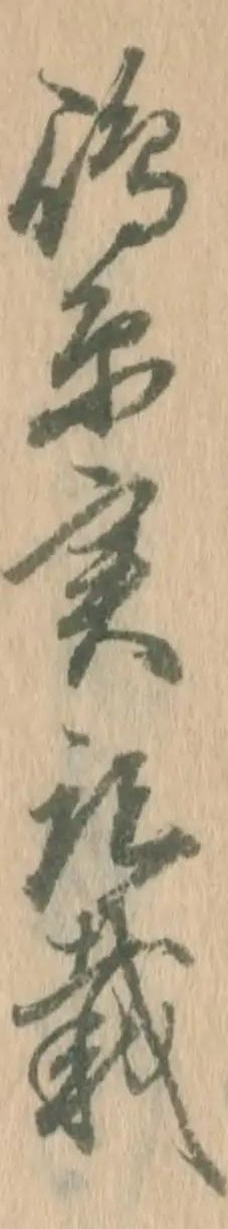島原実記載

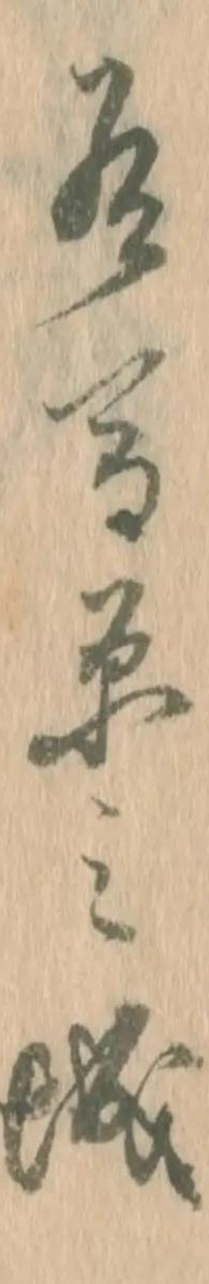有馬原之城
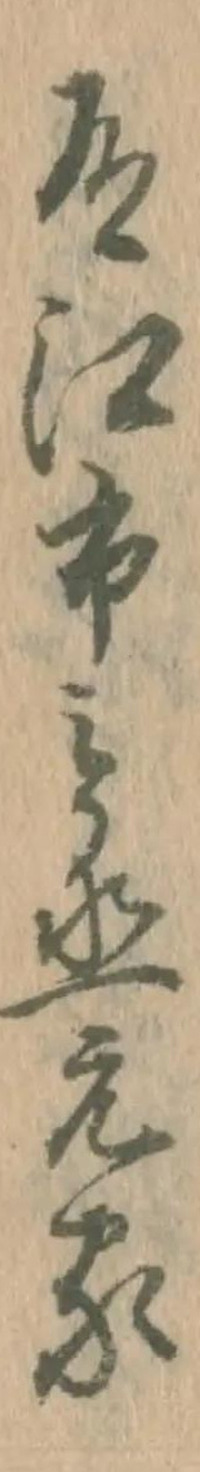有江市之丞元家
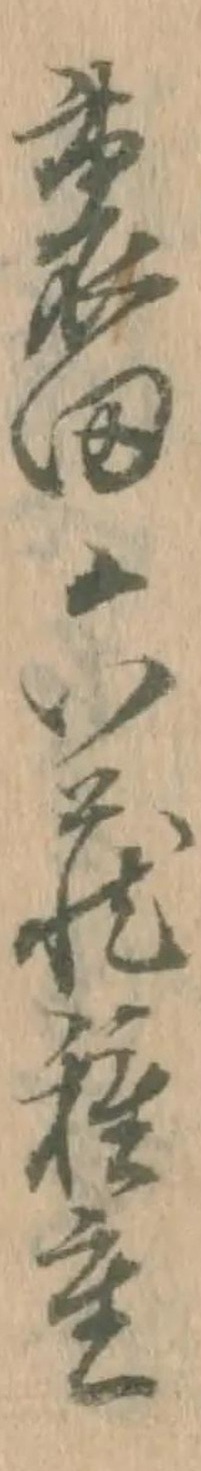蓑田六蔵種重
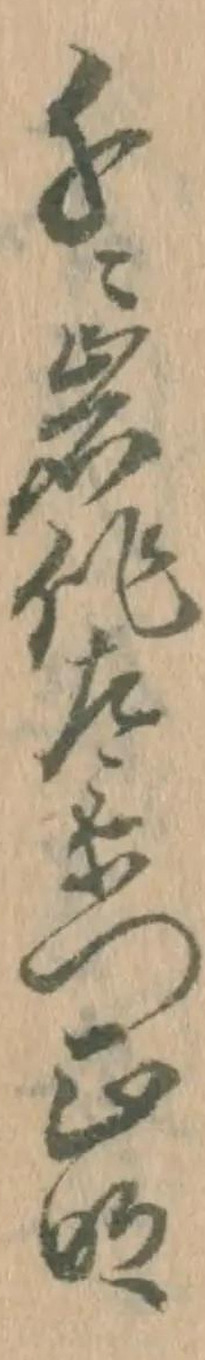千々岩作左衛門正明
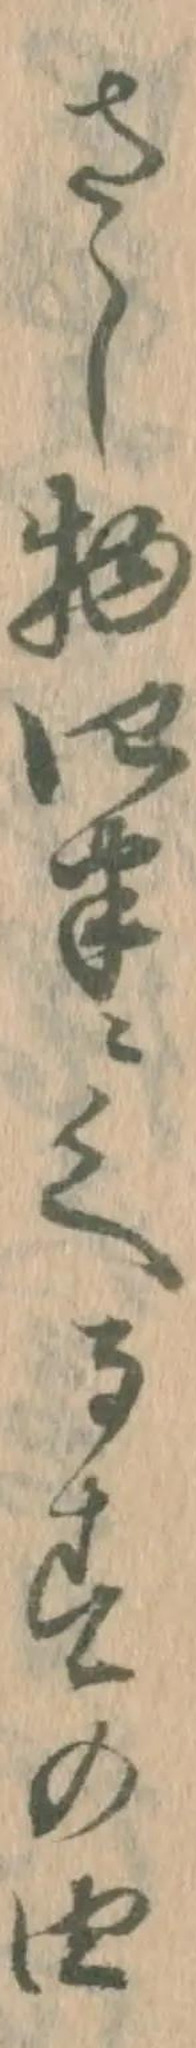さし物四半にくる春の由
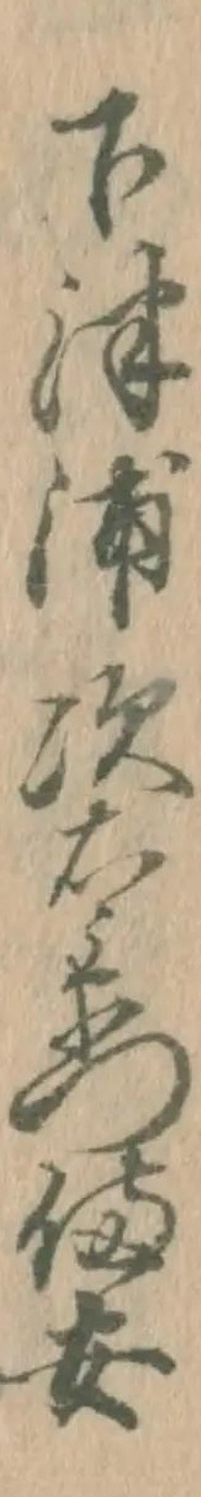下津浦次右衛門備安
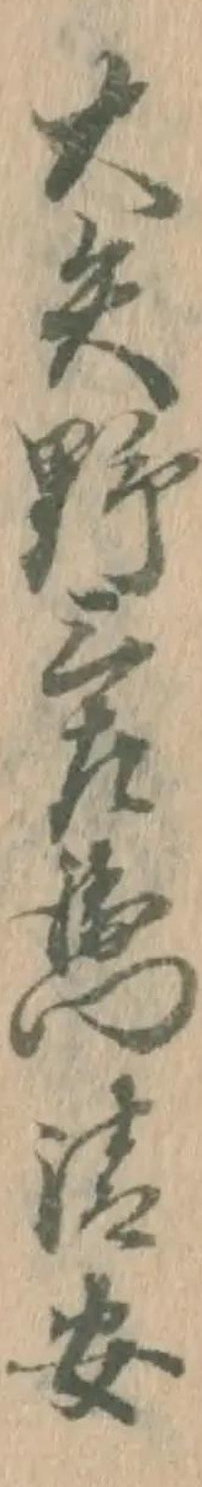大矢野三左衛門清安
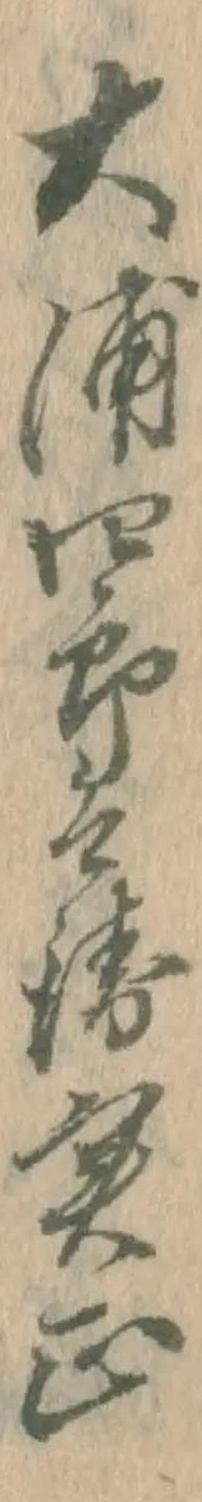大浦四郎兵衛実正
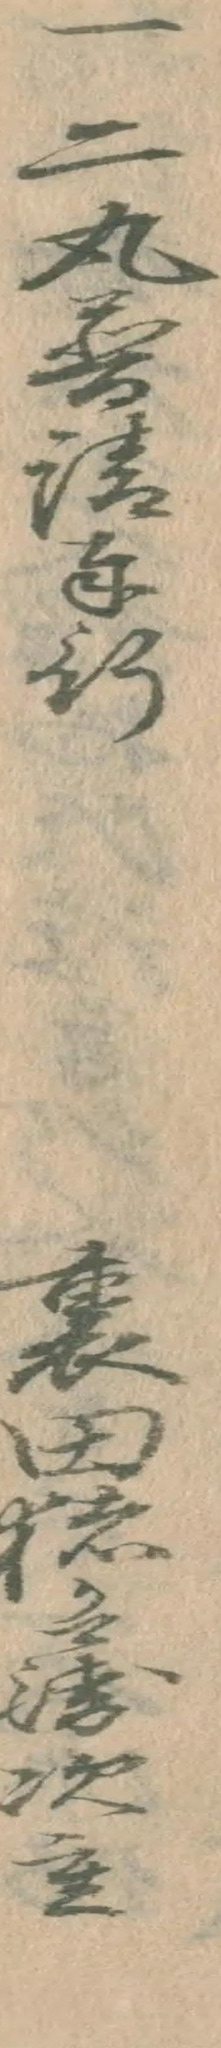一二丸普請奉行蓑田猪兵衛次重
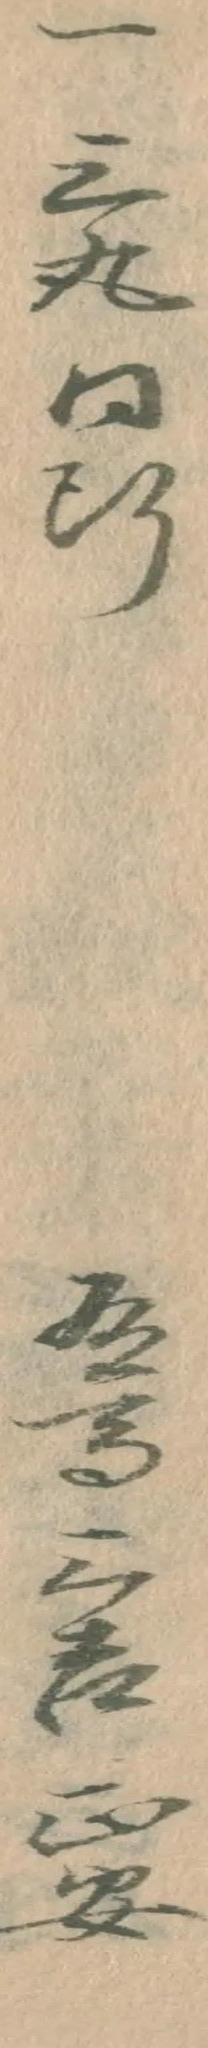一三丸同断有馬三吉正安
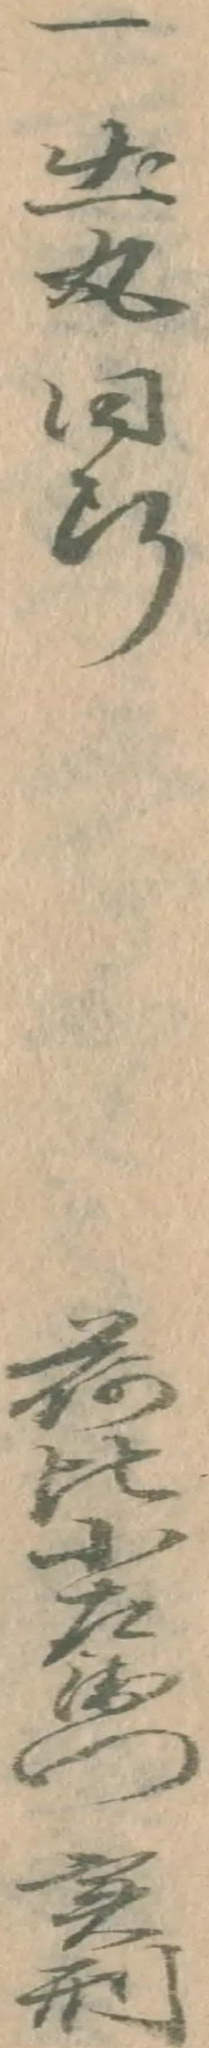一出丸同断荷比小左衛門実刑

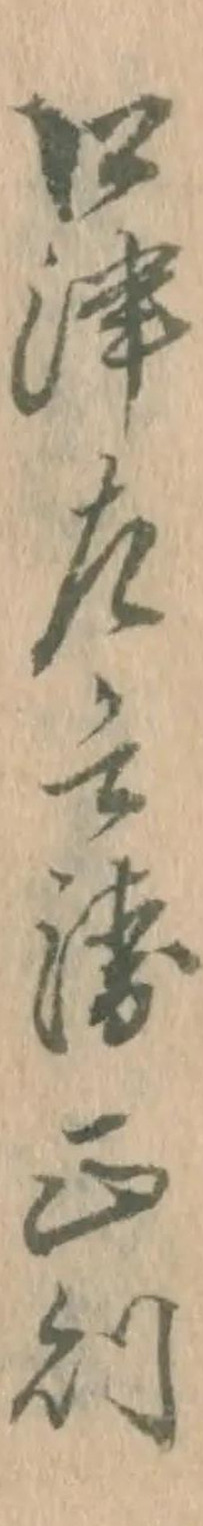口津左兵衛正則
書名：切支丹御退治記 49巻. [6]
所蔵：国立国会図書館 National Diet Library, JAPAN
